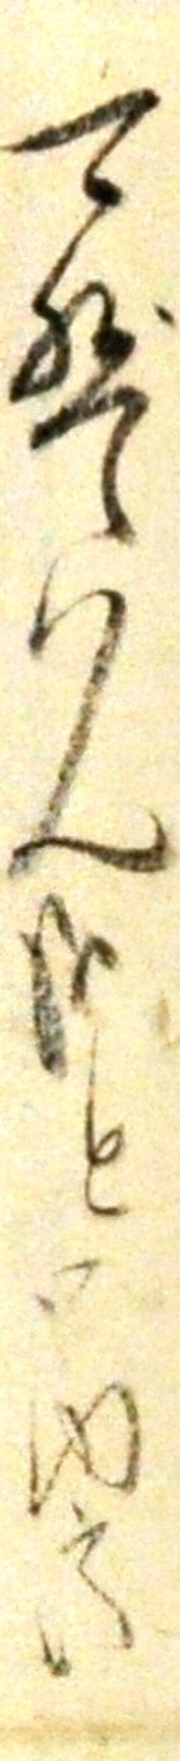可然候はん哉と御内意
